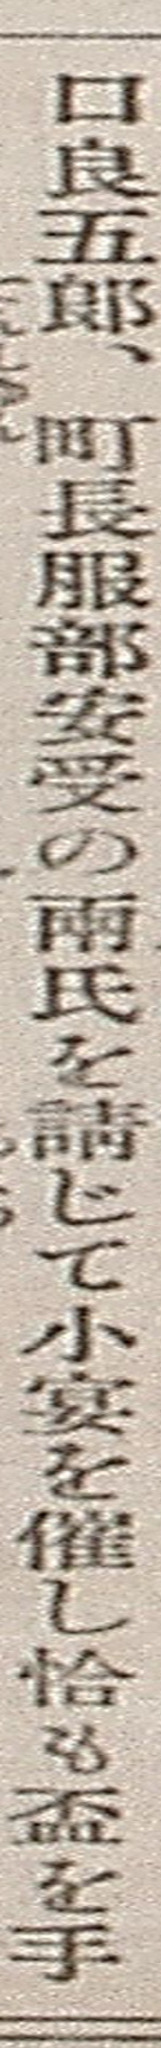口良五郎、町長服部安受の両氏を請じて小宴を催し恰も盃を手
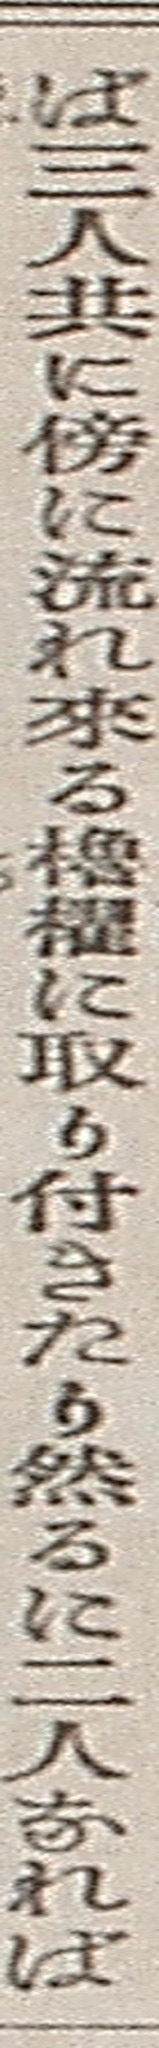ば三人共に傍に流れ来る櫓櫂に取り付きたり然るに二人なれば
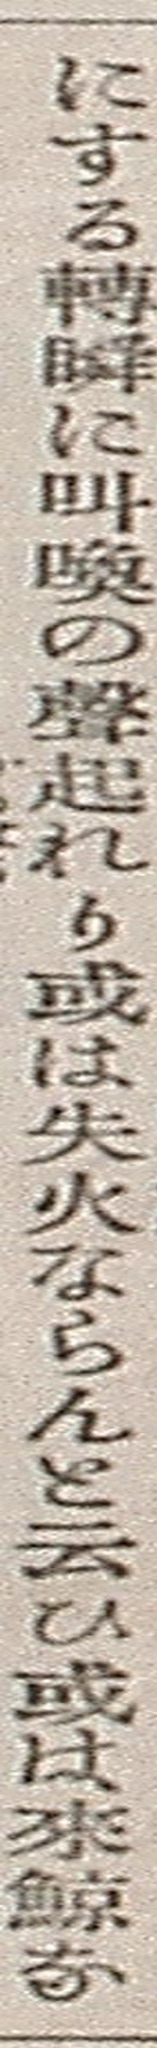にする転瞬に叫喚の声起れり或は失火ならんと云ひ或は来鯨な
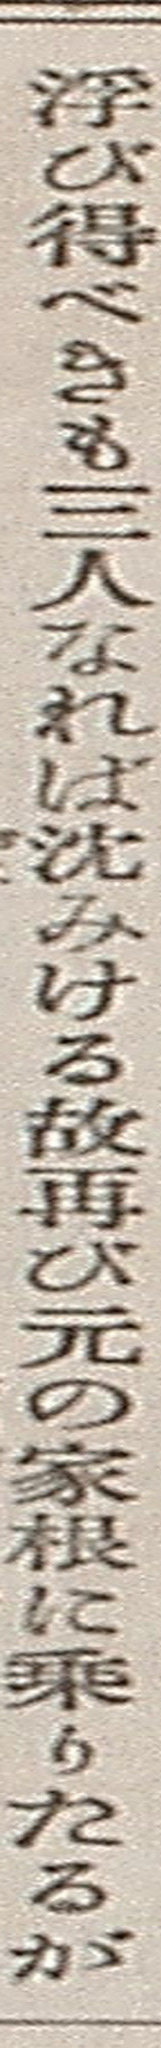浮び得べきも三人なれば沈みける故再び元の屋根に乗りたるが
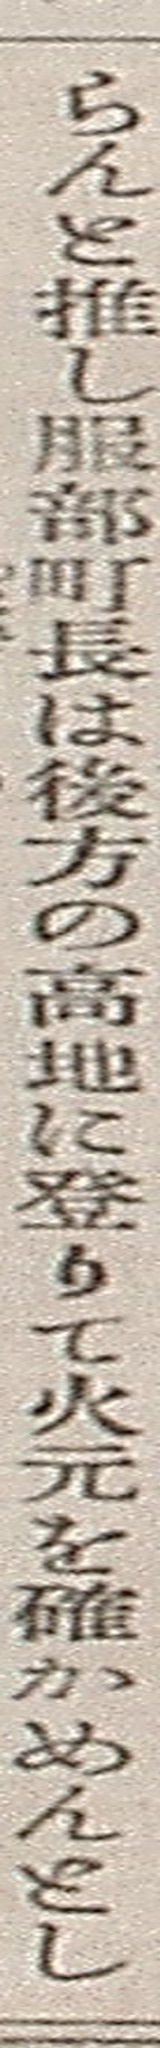らんと推し服部町長は後方の高地に登りて火元を確かめんとし
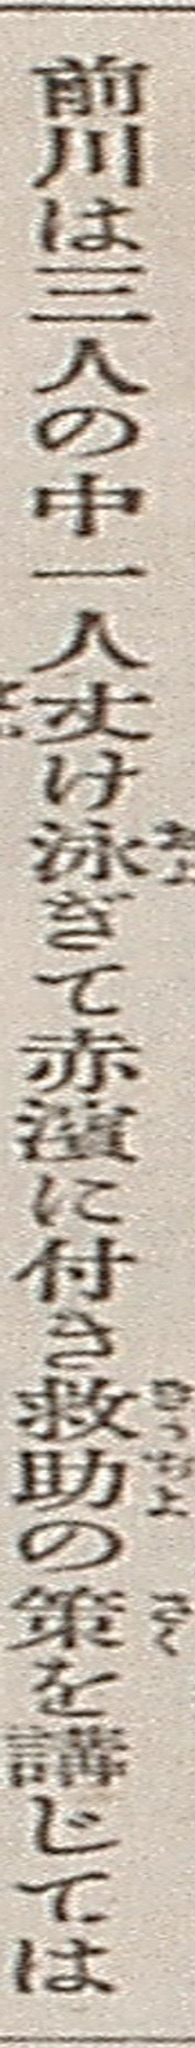前川は三人の中一人丈け泳ぎて赤浜に付き救助の策を講じては
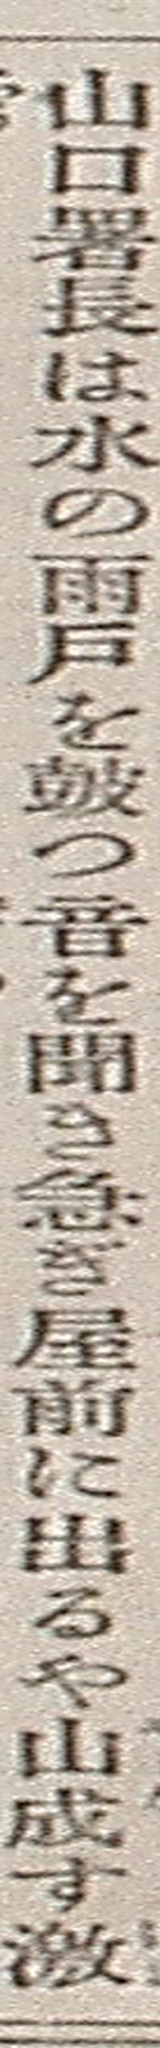山口署長は水の雨戸を皷つ音を聞き急ぎ屋前に出るや山成す激
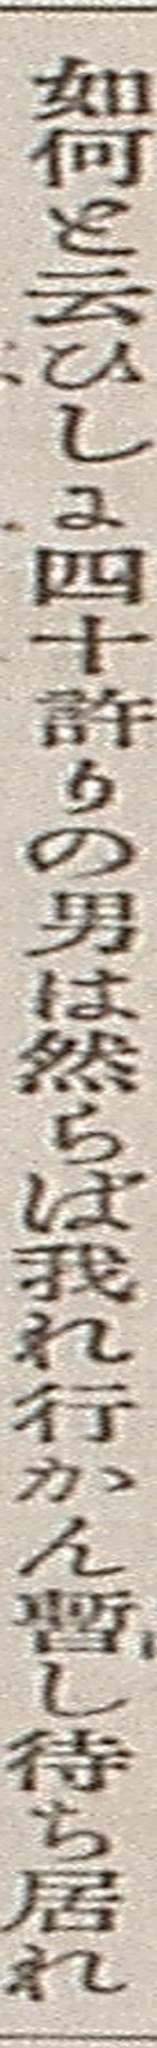如何と云ひしに四十許りの男は然らば我れ行かん暫し待ち居れ
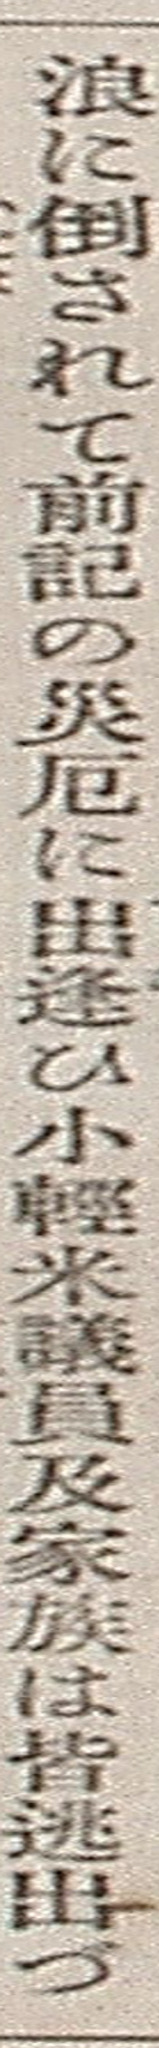浪に倒されて前記の災厄に出逢ひ小軽米議員及家族は皆逃出づ
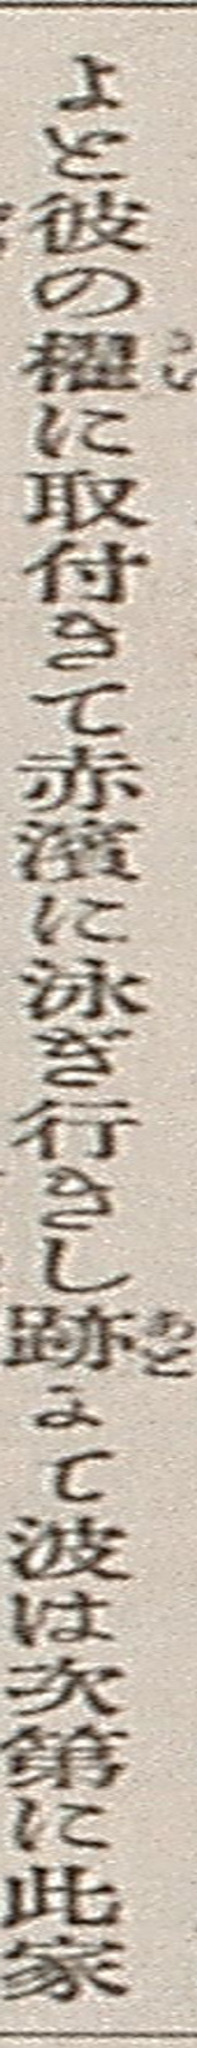よと彼の櫂に取付きて赤浜に泳ぎ行きし跡にて彼は次第に此家
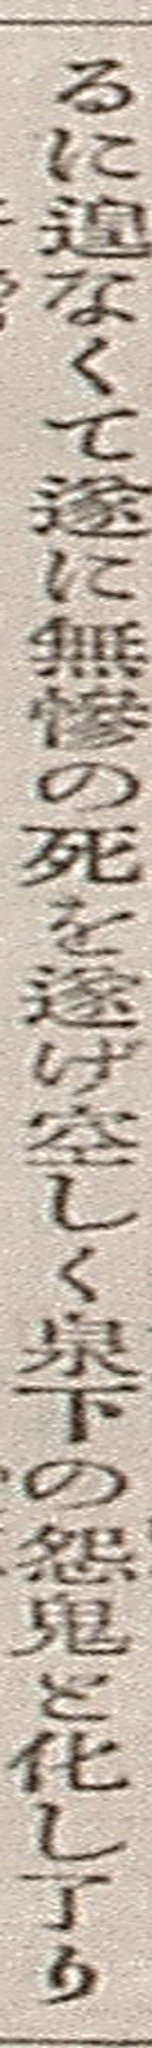るに遑なくて遂に無惨の死を遂げ空しく泉下の怨鬼と化し了り
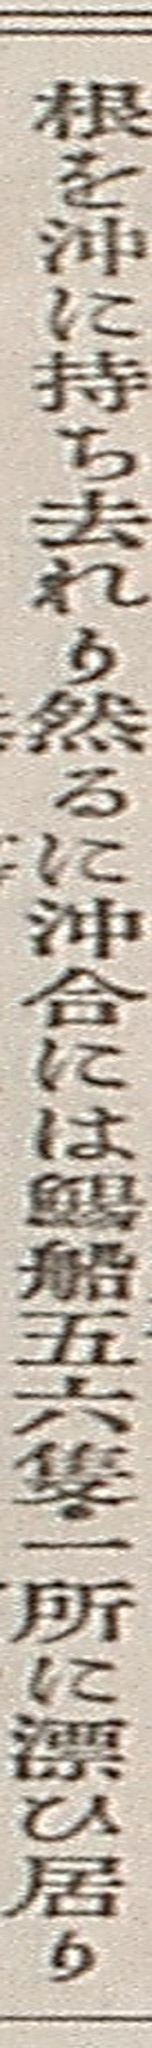根を沖に持ち去れり然るに沖合には鯣船五六隻一所に漂ひ居り
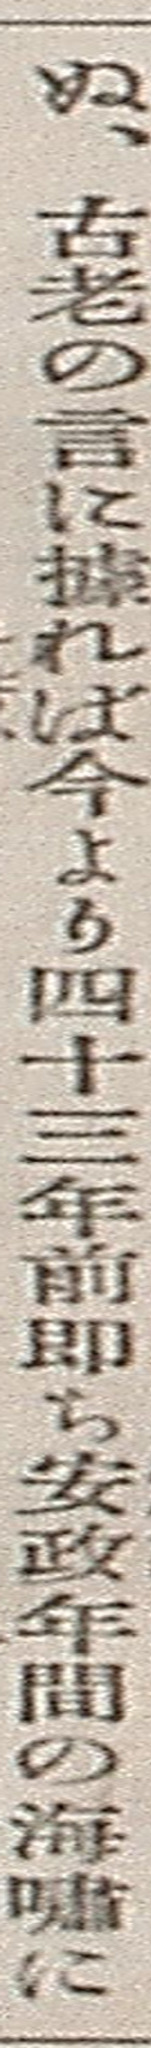ぬ、古老の言に拠れば今より四十三年前即ち安政年間の海嘯に
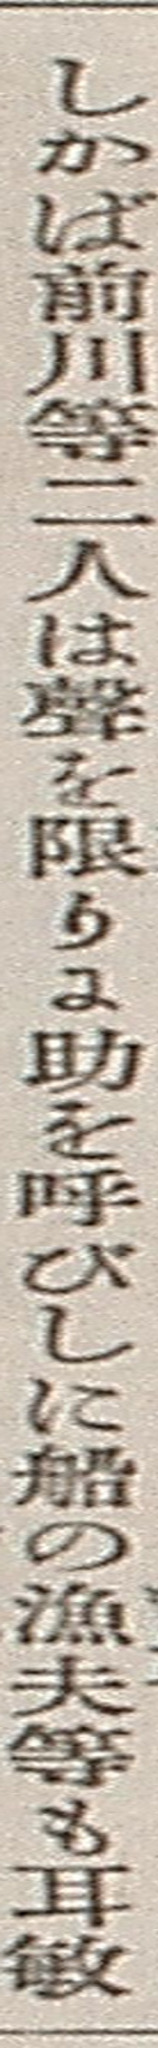しかば前川等二人は声を限りに助を呼びしに船の漁夫等も耳敏
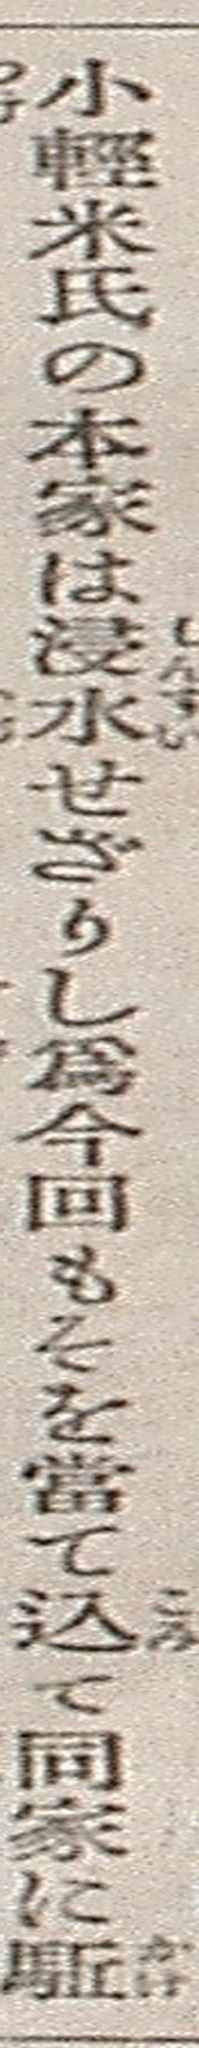小軽米氏の本家は浸水せざりし為今回もそを当て込て同家に駈
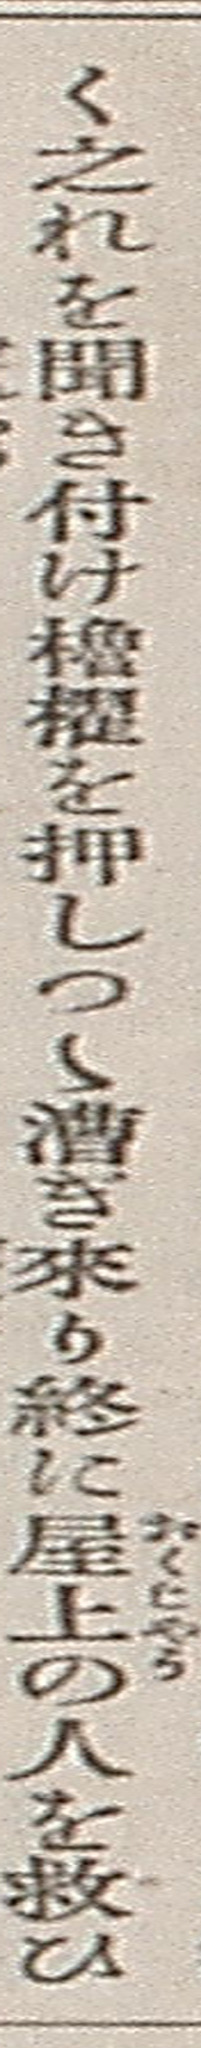く之れを聞き付け櫓櫂を押しつゝ漕ぎ来り終に屋上の人を救ひ
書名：風俗畫報臨時増刊第百十九號　大海嘯被害録（中）
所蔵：東京大学地震研究所図書室 Earthquake Research Institute Library, The University of Tokyo, JAPAN
